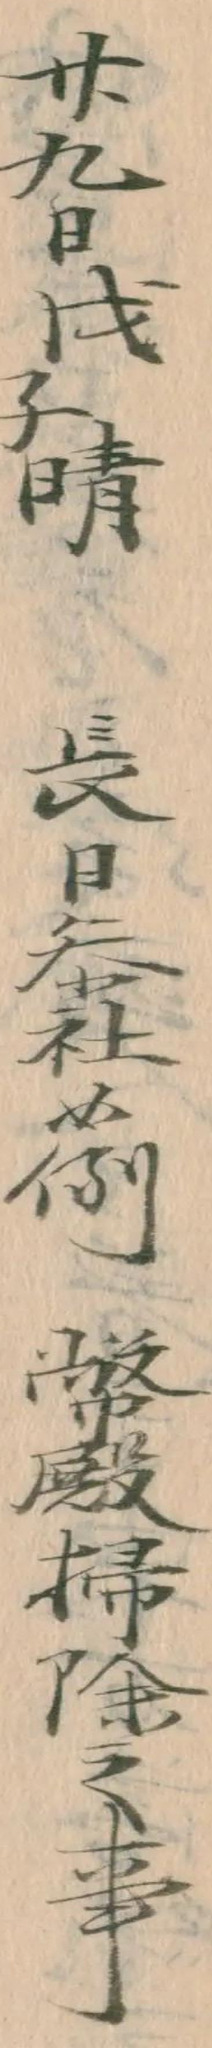廿九日戊子晴長日参社如例幣殿掃除之事
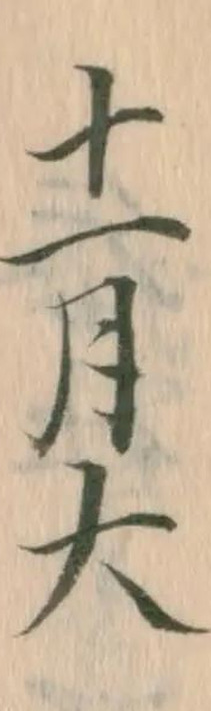十一月大
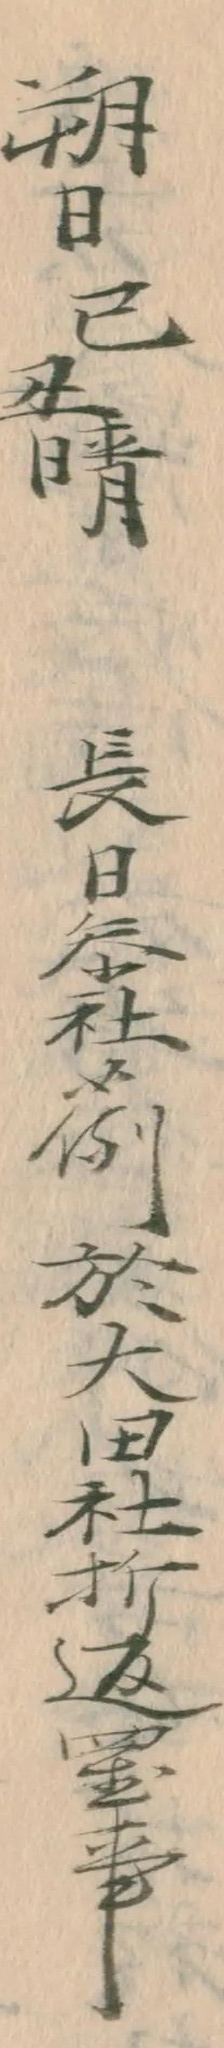朔日己丑晴長日参社如例於大田杜折返置事
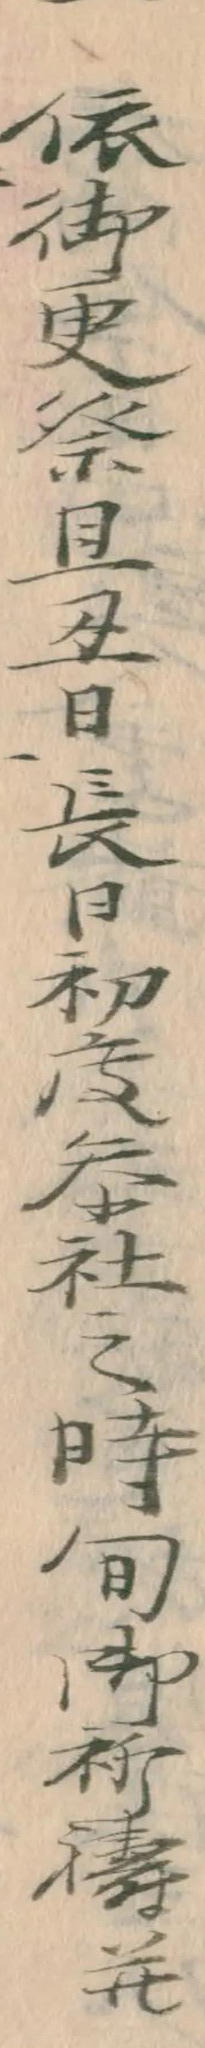一依御更祭且丑日長日初度参社之時旬御祈祷并
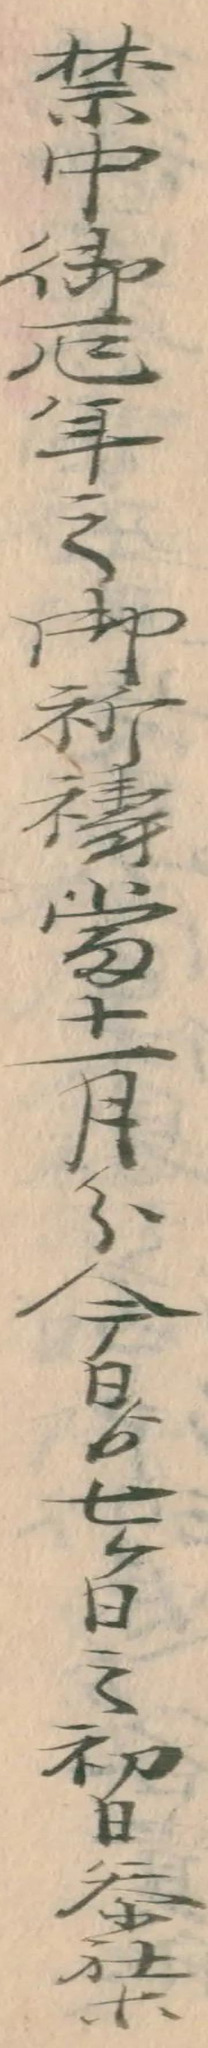禁中御厄年之御祈祷當十一月分今日ゟ七ケ日之初日参社等
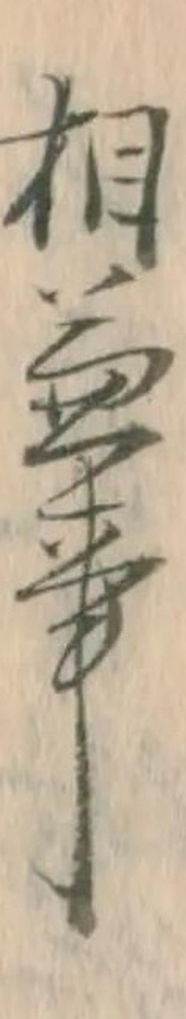相兼事
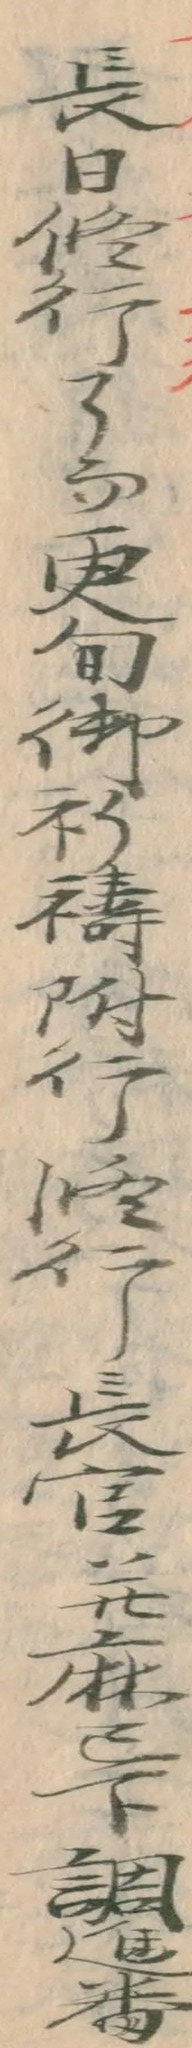一長日修行了而更旬御祈祷附行修行長官并麻已下調進番
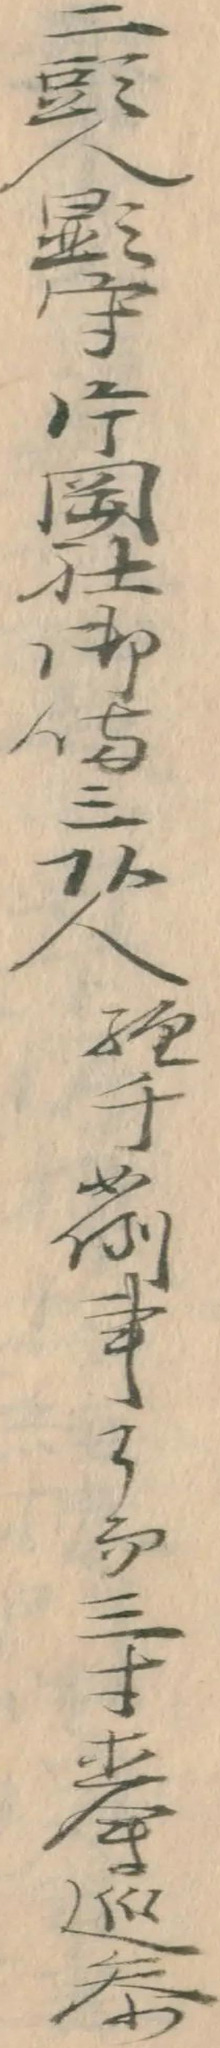二頭人顕守片岡社御備三頭人経千如例事了而三寸直會巡参

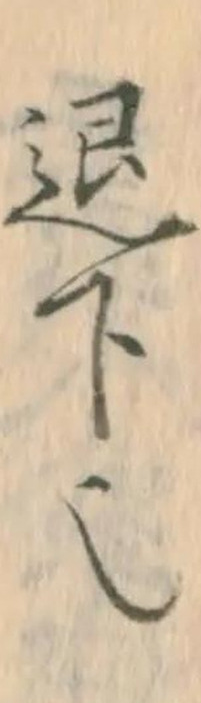退下也
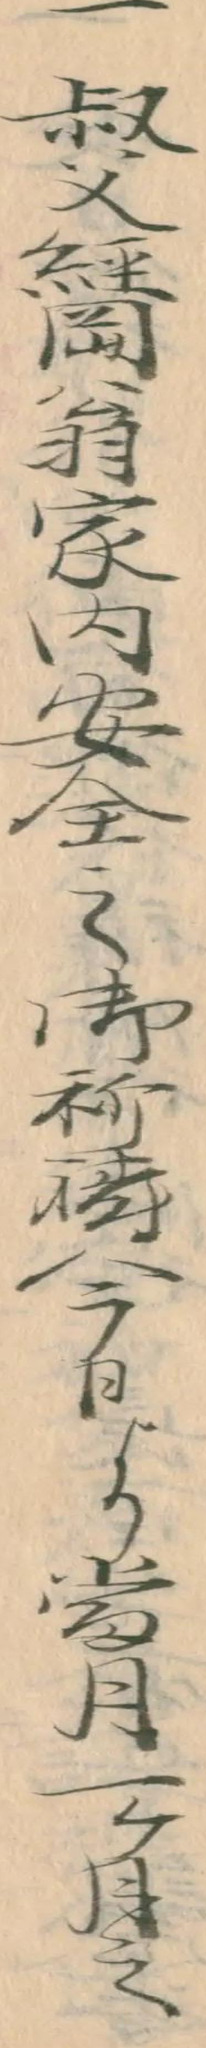一叔父経岡翁家内安全之御祈祷今日より當月一ヶ月之
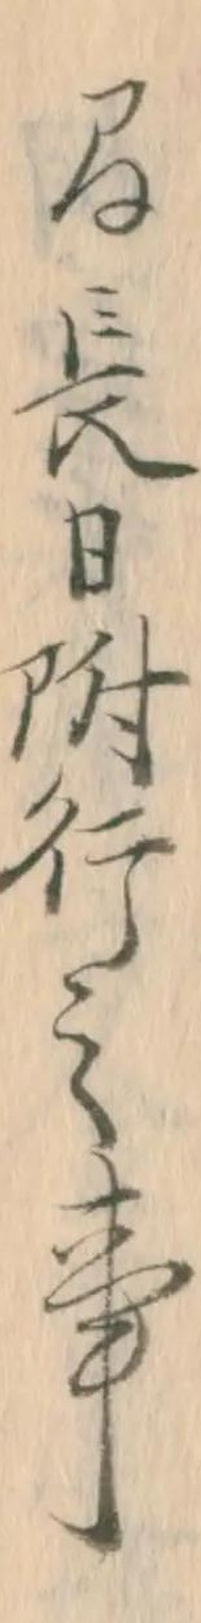間長日附行之事
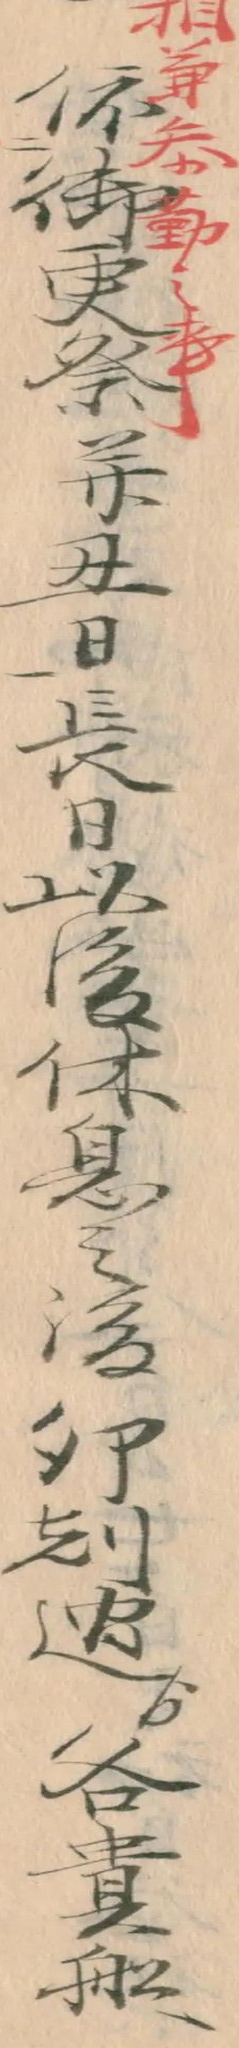一依御更祭并丑日長日以後休息之後卯刻過ゟ各貴舩へ
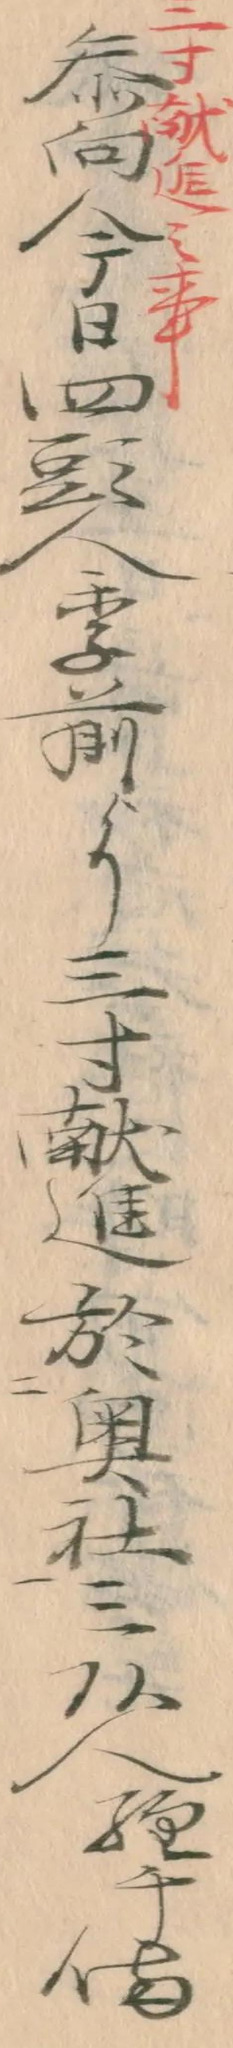参向今日四頭人季前より三寸献進於奥社三頭経千備
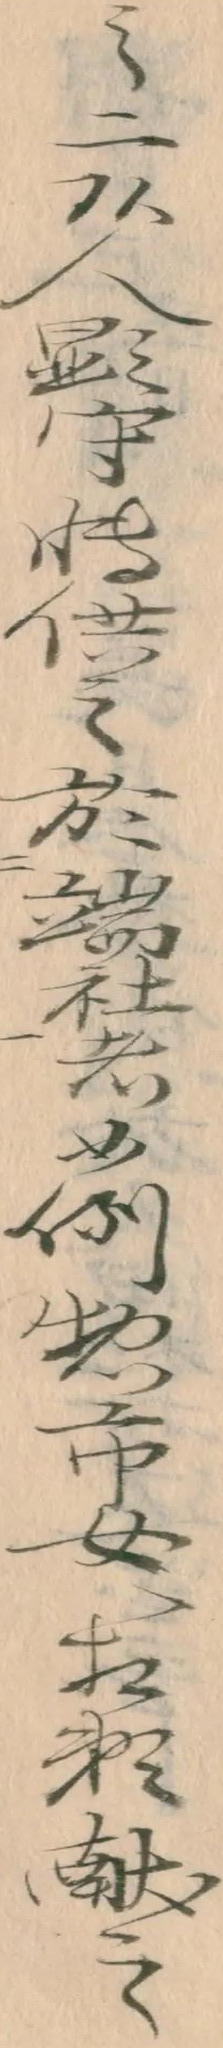之二頭人顕守轉供之於端社は如例惣市女へ相頼献之
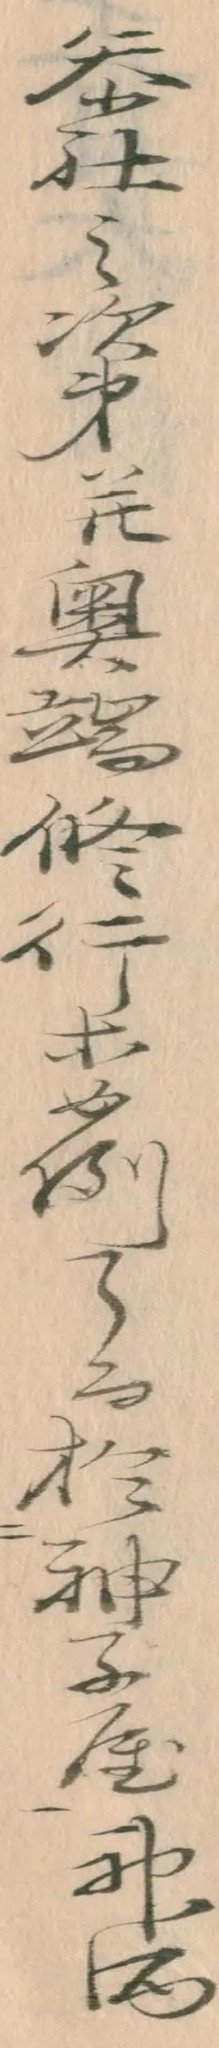参社之次第并奥端修行等如例了而於神子屋神酒
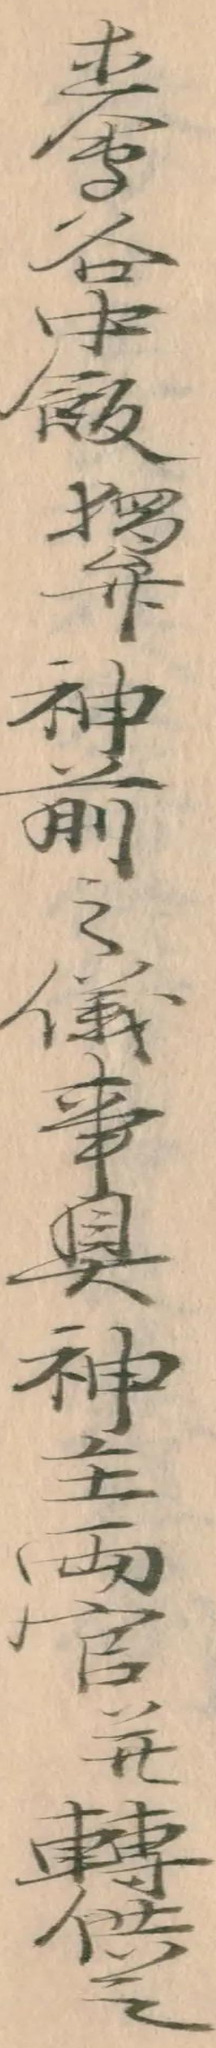直會各中飯獨弁神前之儀事具神主両官并轉供之
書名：賀茂社記録. 第74冊
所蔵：国立国会図書館 National Diet Library, JAPAN
